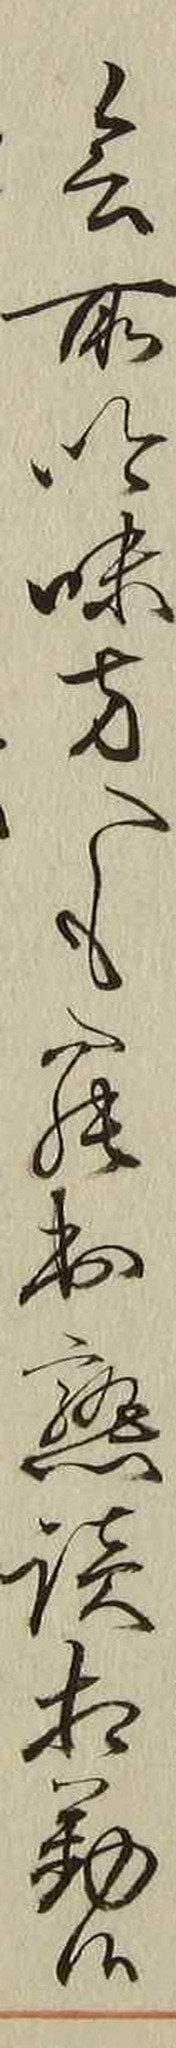会所吟味方へも罷出熟談相勤候
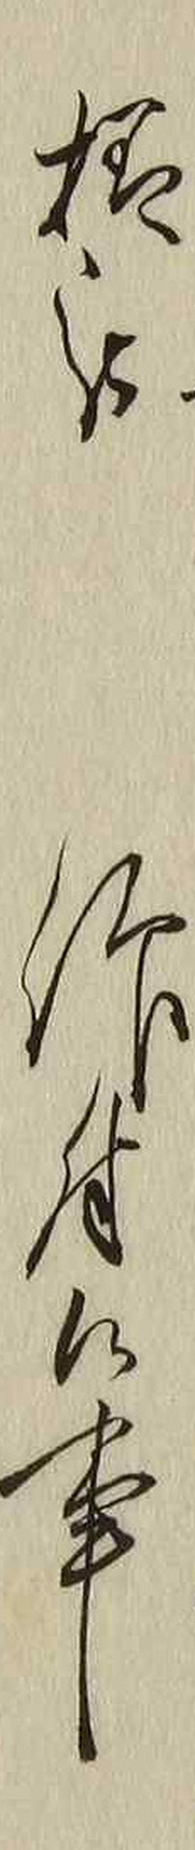様被仰付候事
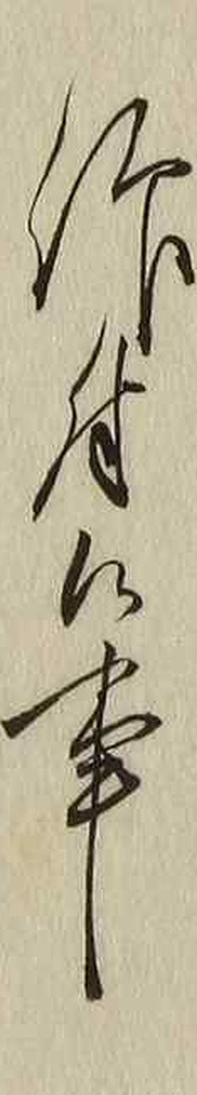仰付候事
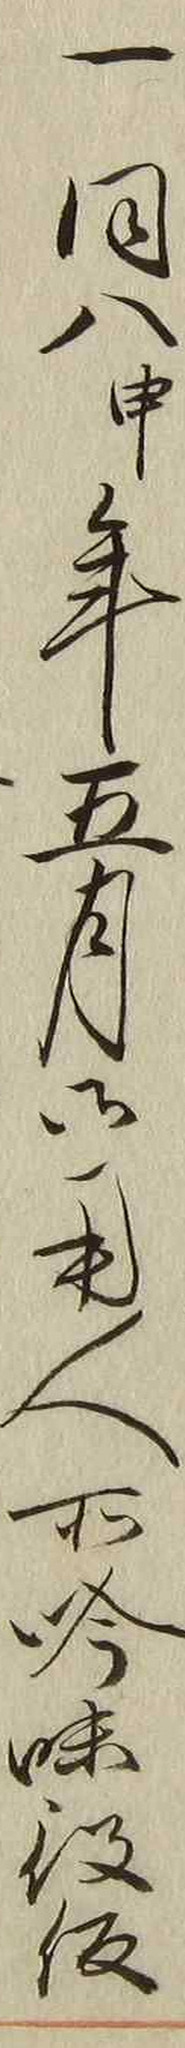一同八申年五月御用人所吟味役仮
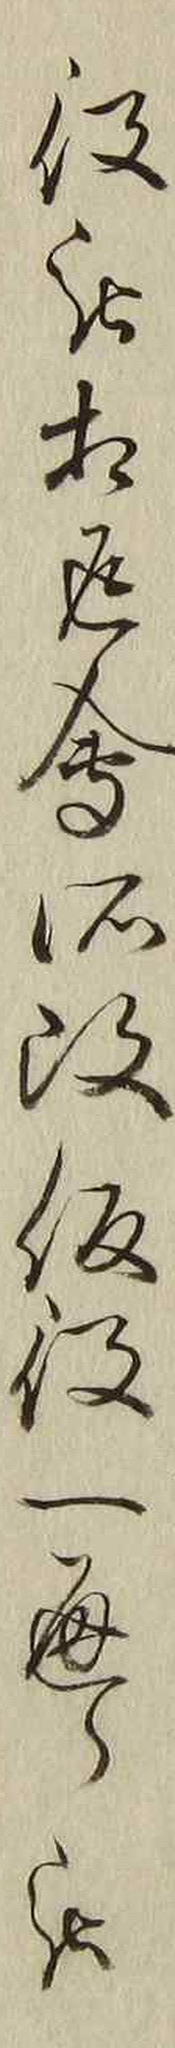役被相返会所改仮役一通り被
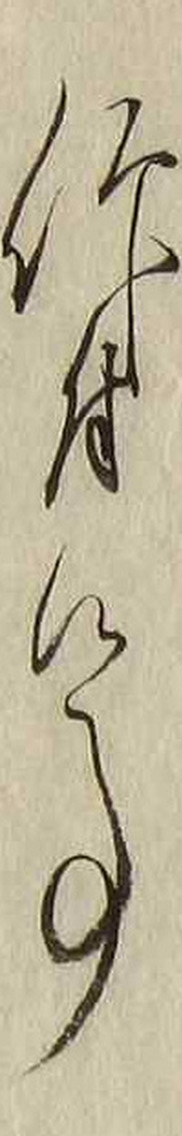仰付候事
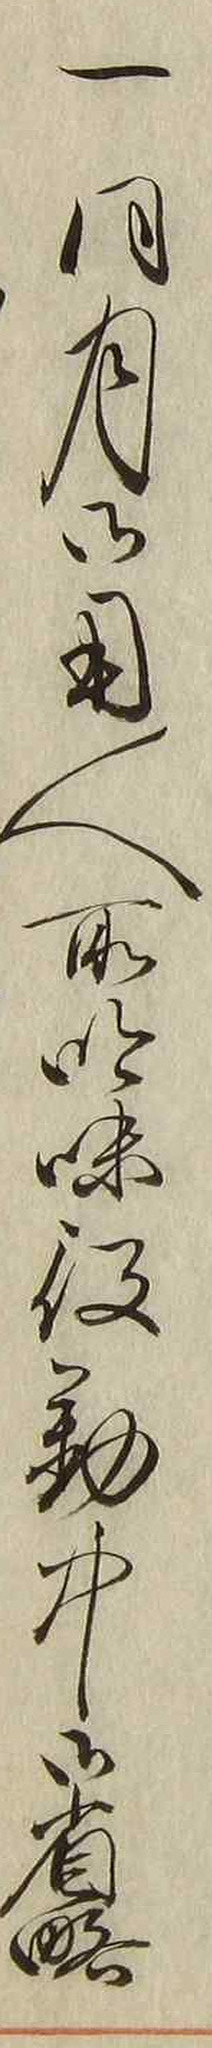一同月御用人所吟味役勤中御省略
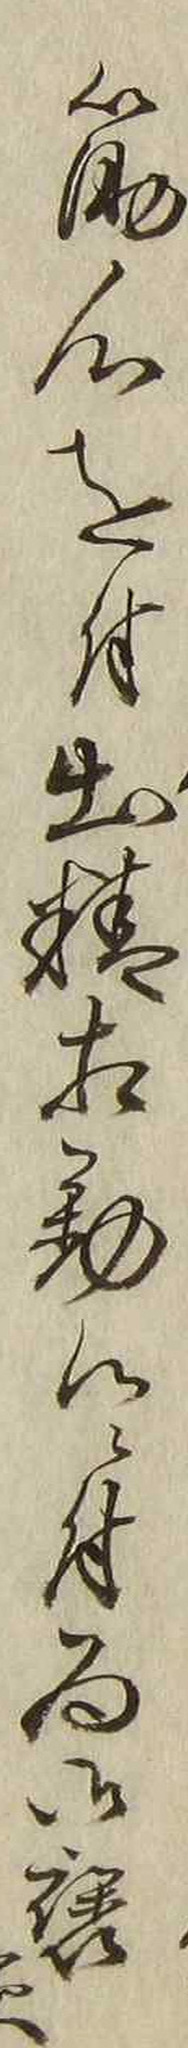筋心を付出精相勤候ニ付為御褒美
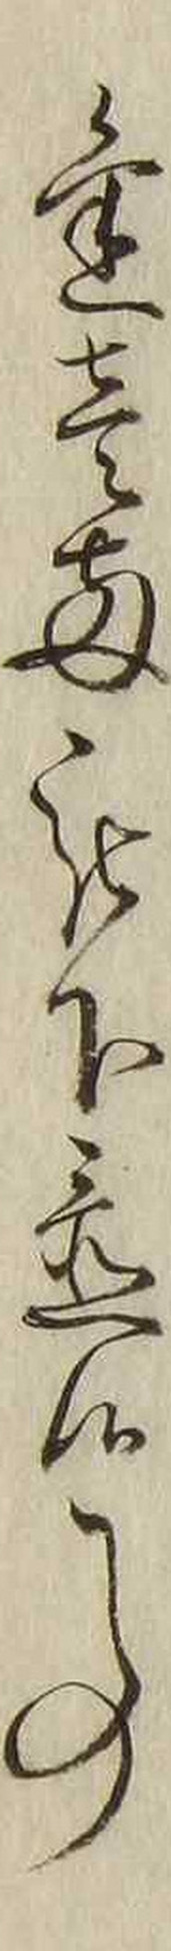金壱両被下置候事

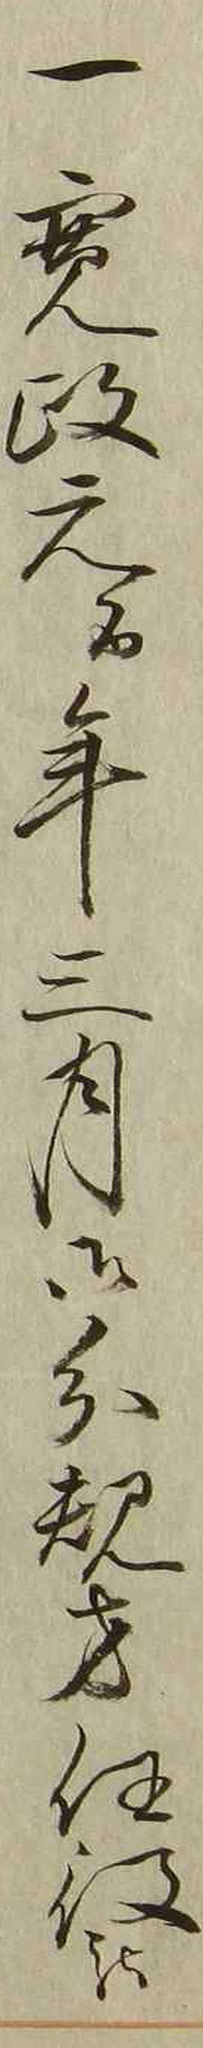一寛政元酉年三月御分規方任役被
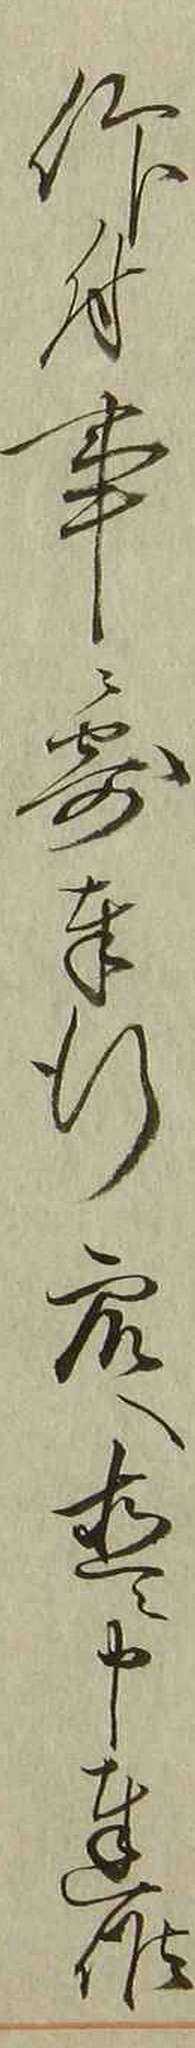仰付事ニ寄奉行衆へ直ニ申達候
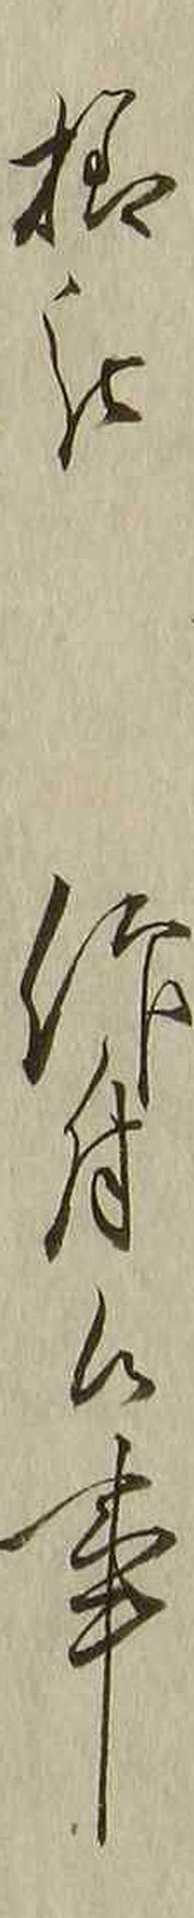様被仰付候事
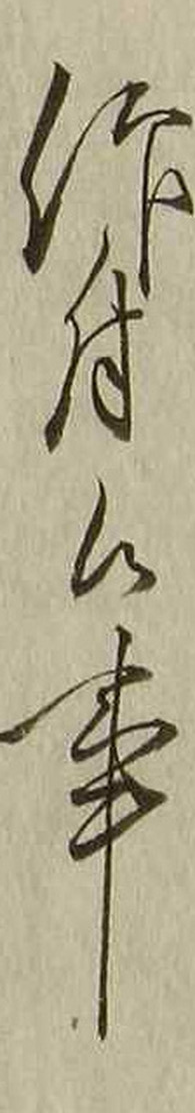仰付候事
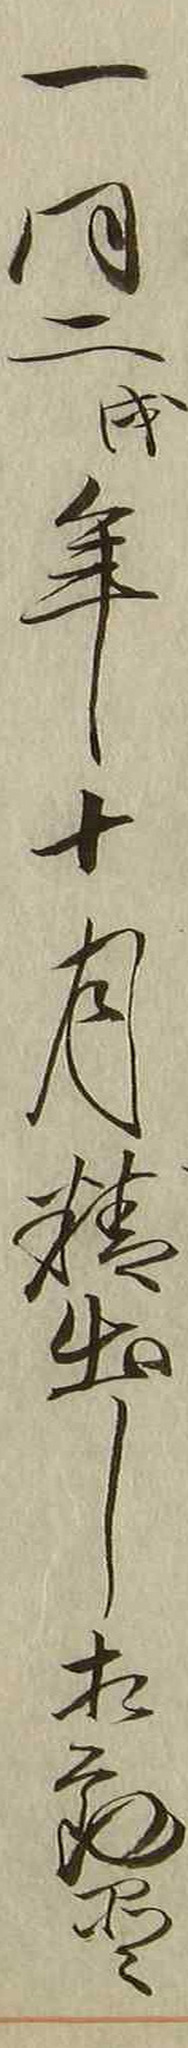一同二戌年十月精出し相勤品々
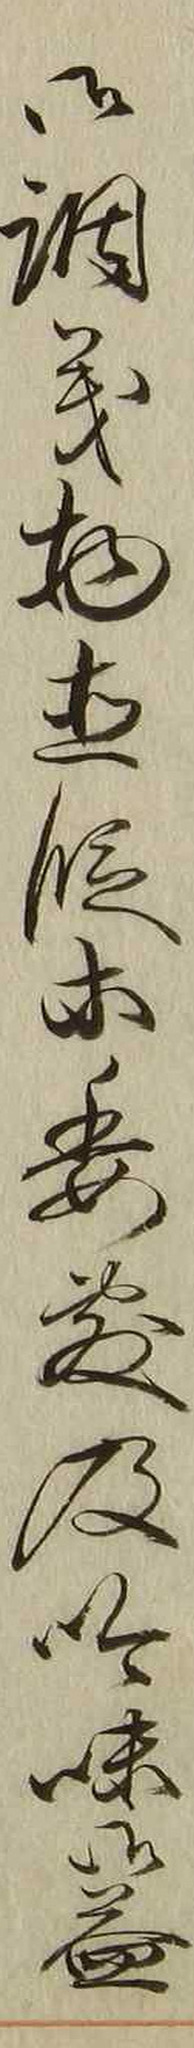御調義物直段等委敷及吟味御益
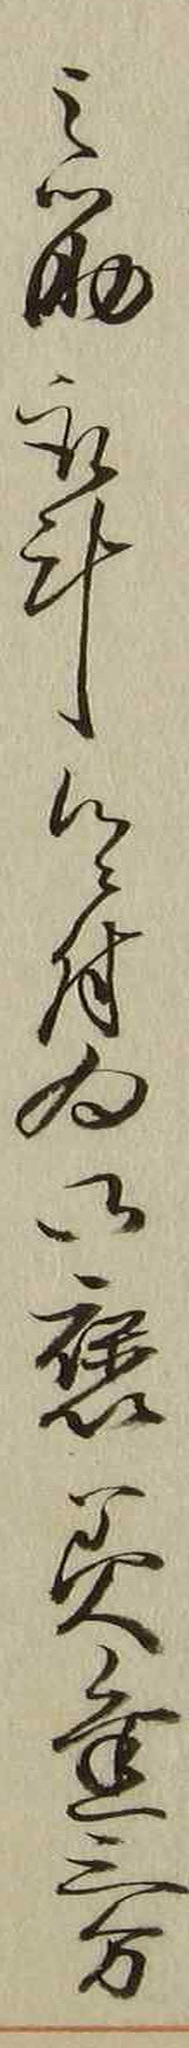之筋取計候ニ付為御褒美金三分
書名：諸士系譜　巻之57　ほ之部4
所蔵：会津若松市立会津図書館
